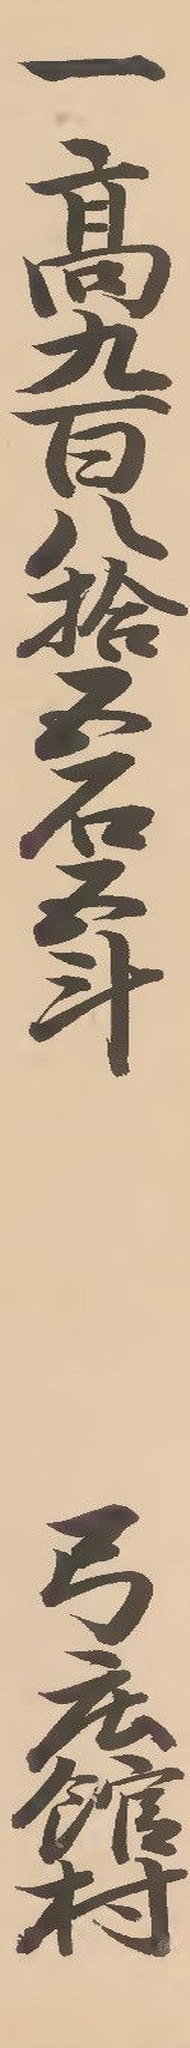一高九百八拾五石五斗弓庄館村
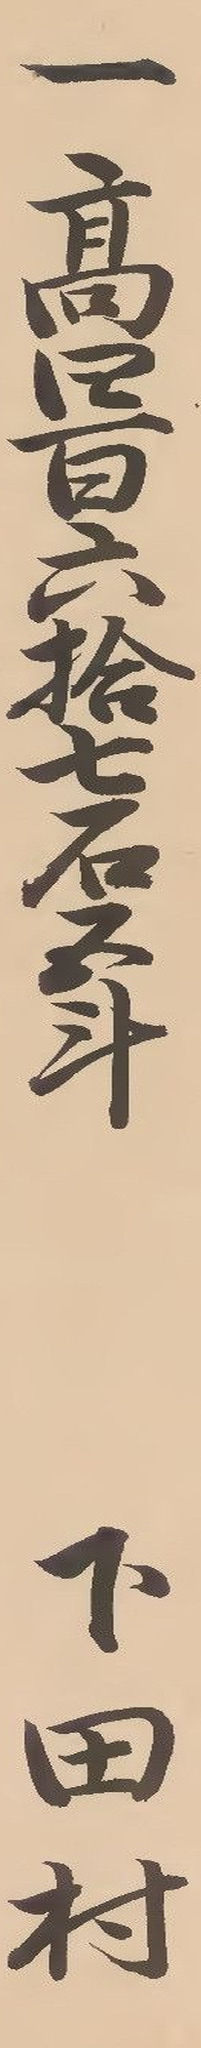一高四百六拾七石五斗下田村
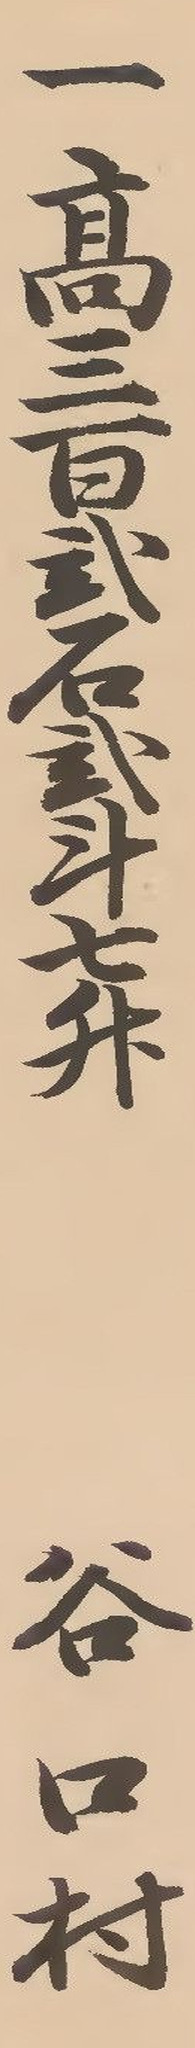一高三百弐石弐斗七升谷口村
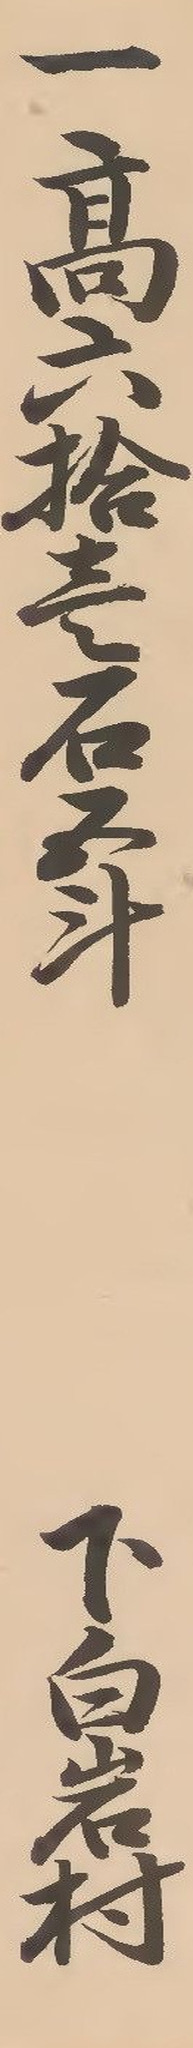一高六拾壱石五斗下白岩村

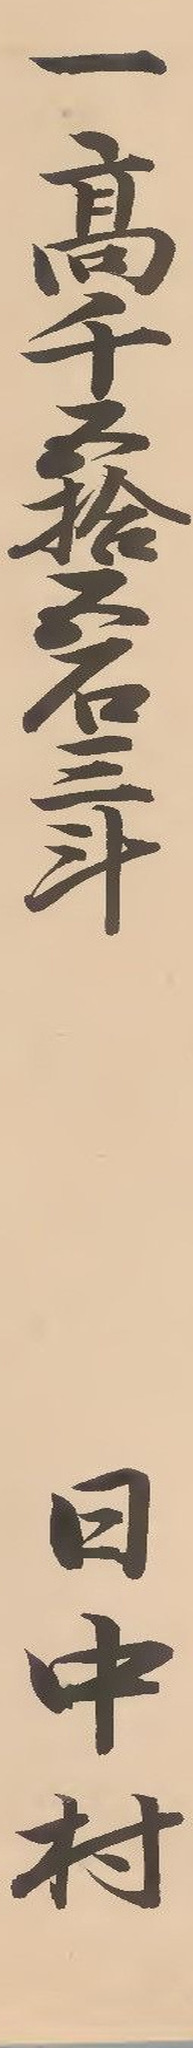一高千五拾五石三斗日中村
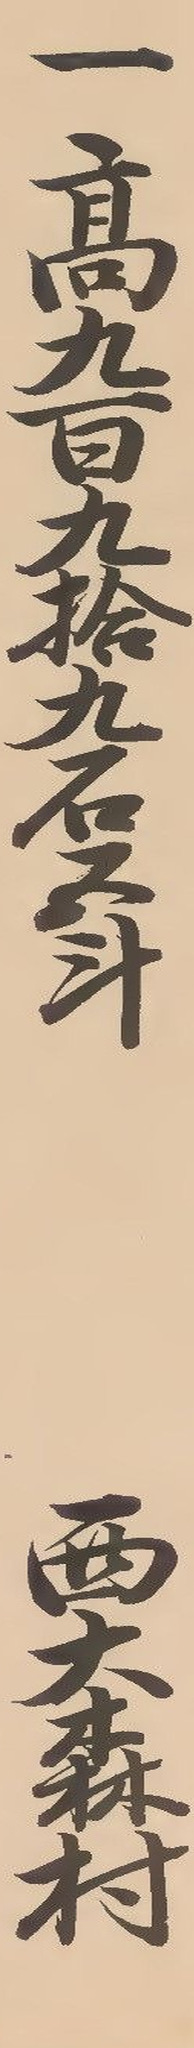一高九百九拾九石五斗西大森村
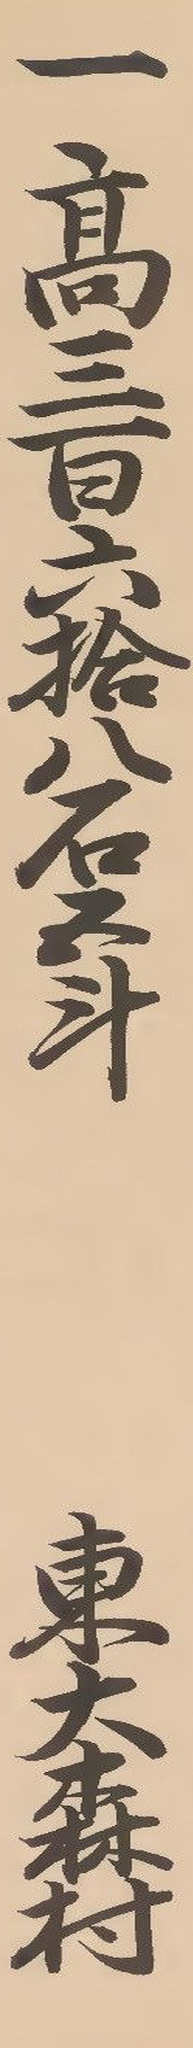一高三百六拾八石五斗東大森村

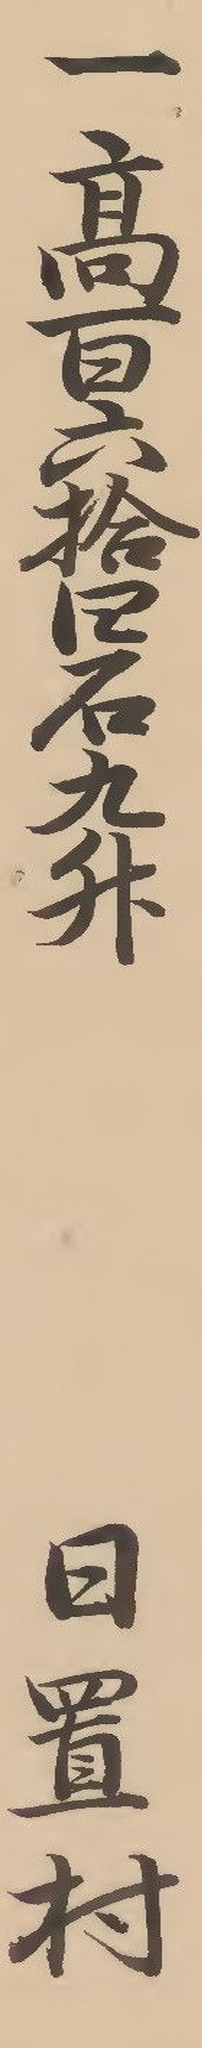一高百六拾四石九升日置村
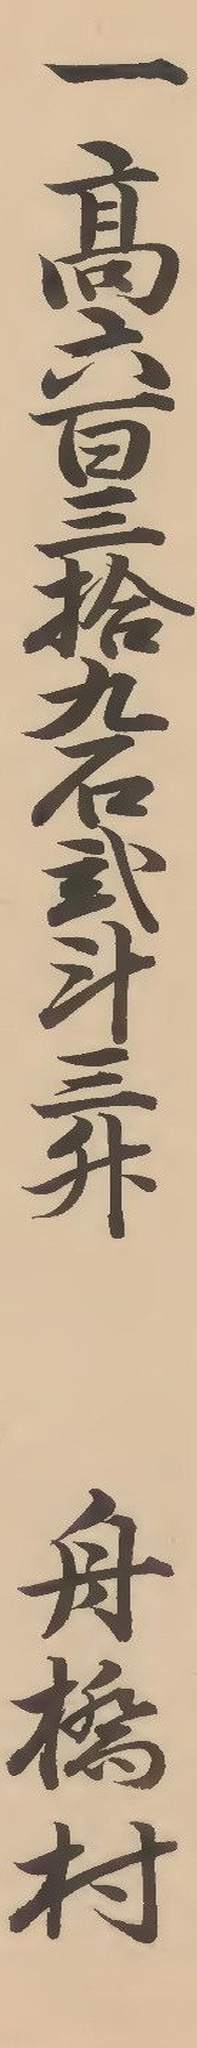一高六百三拾九石弐斗三升舟橋村
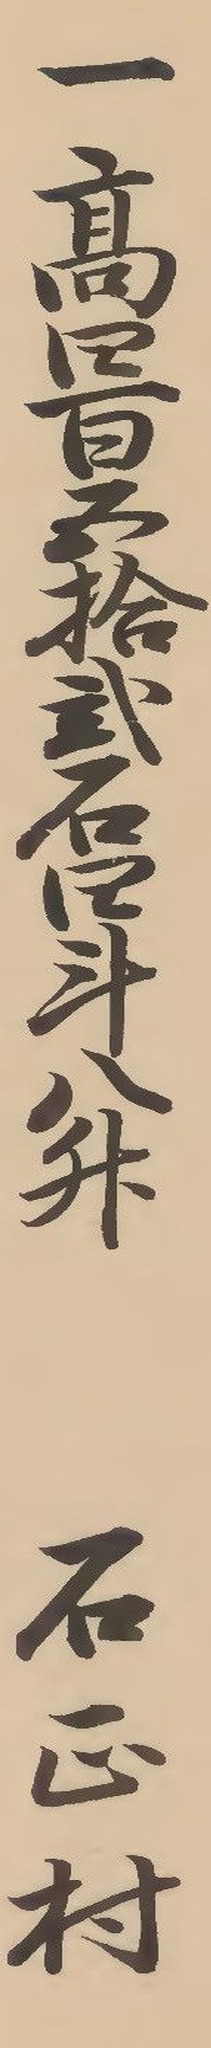一高四百五拾弐石四斗八升石正村
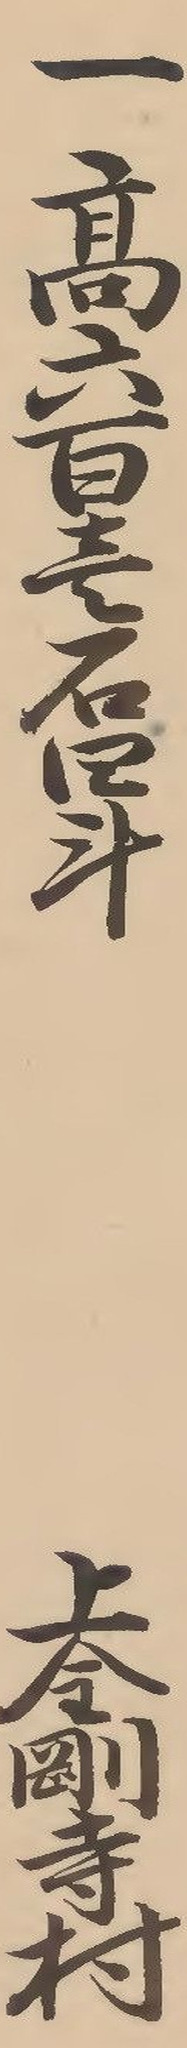一高六百壱石四斗上金剛寺村
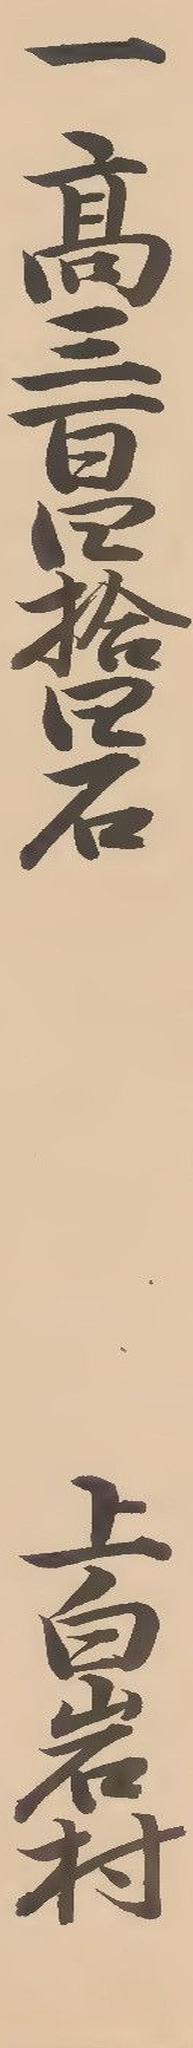一高三百四拾四石上白岩村
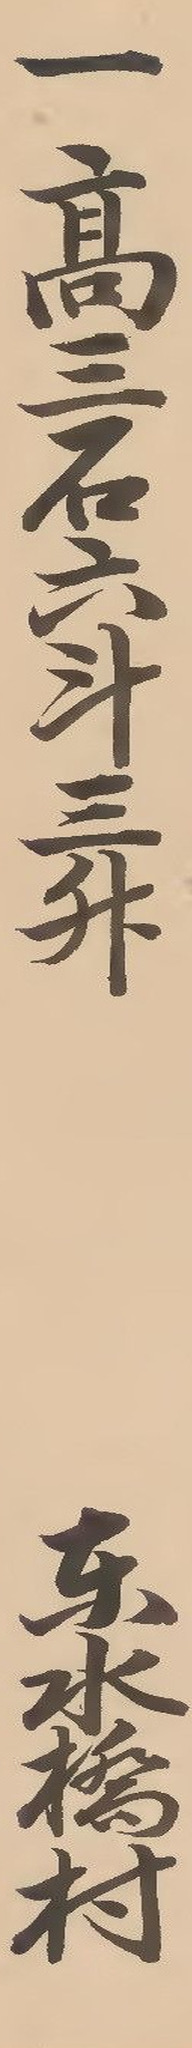一高三石六斗三升東水橋村

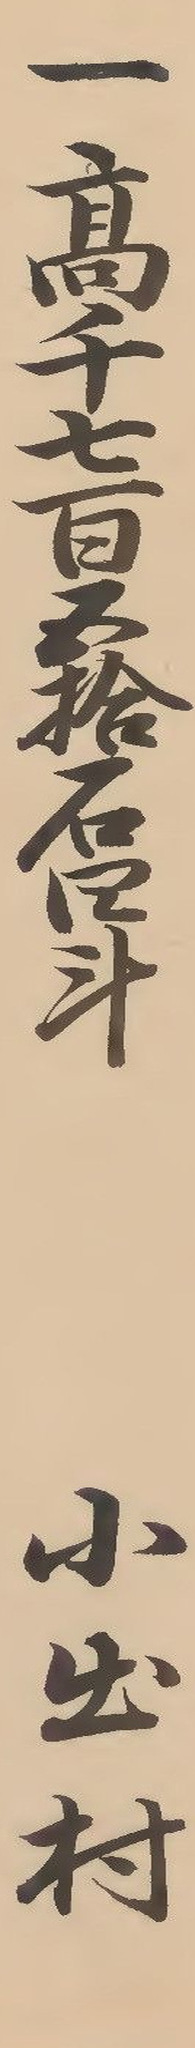一高千七百五拾石四斗小出村
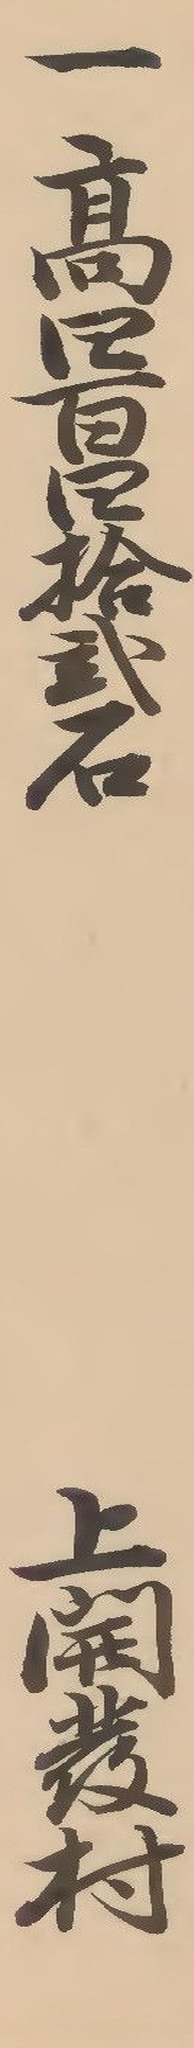一高四百四拾弐石上開発村
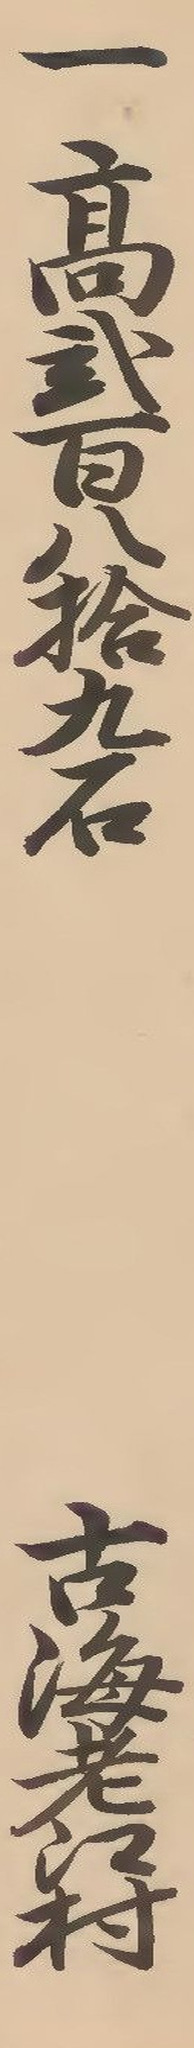一高弐百八拾九石古海老江村
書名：越中国郷帳
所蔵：国立公文書館 National Archives of Japan
